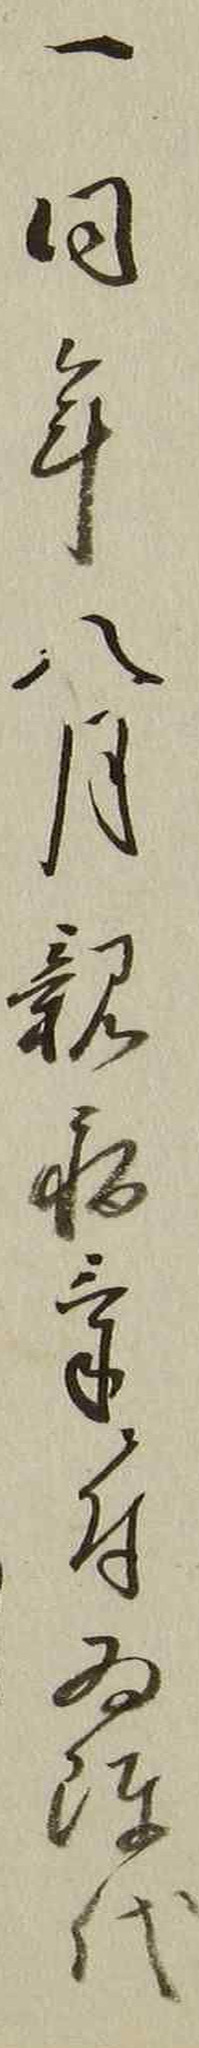一同年八月親病気ニ付為陣代
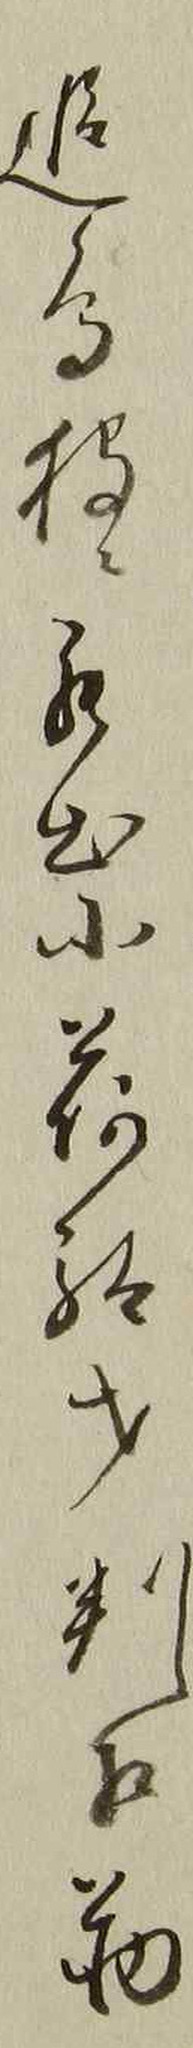追鳥狩ニ罷出小荷駄才判相勤
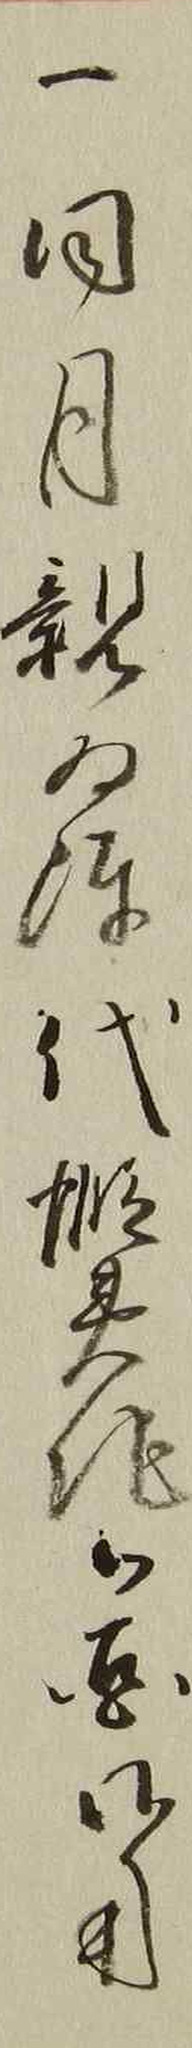一同月親為陣代蝦夷地御固御用
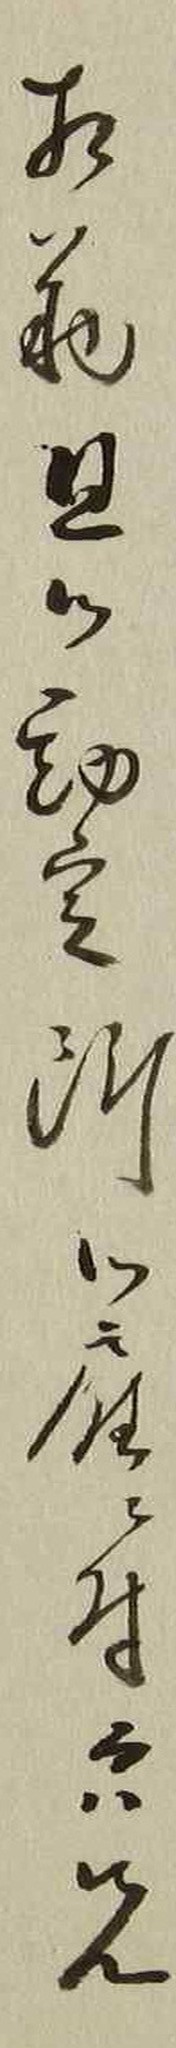相勤旦御勘定所御雇ニ付而ハ先
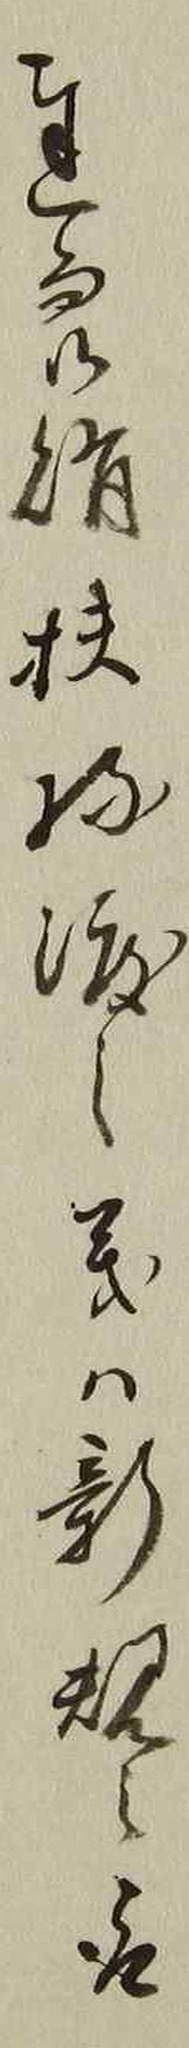達而御賄扶持渡之義ハ新規之取
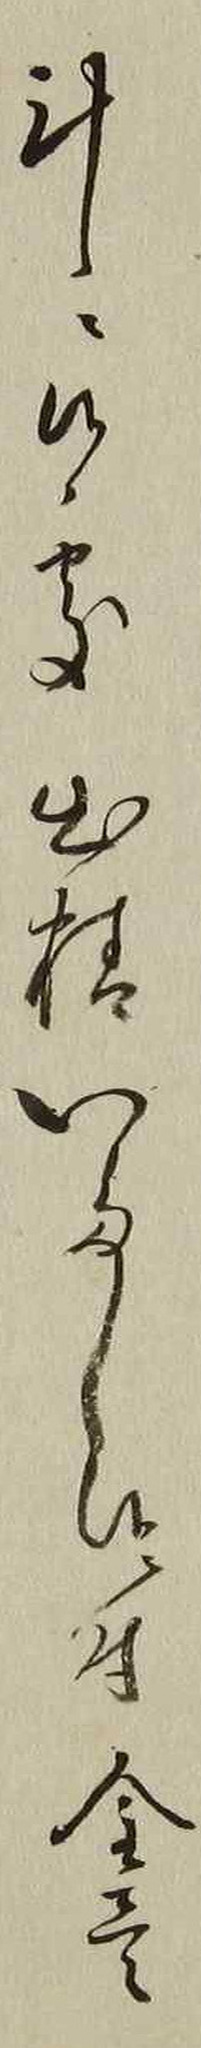計ニ候処出精いたし候ニ付金壱
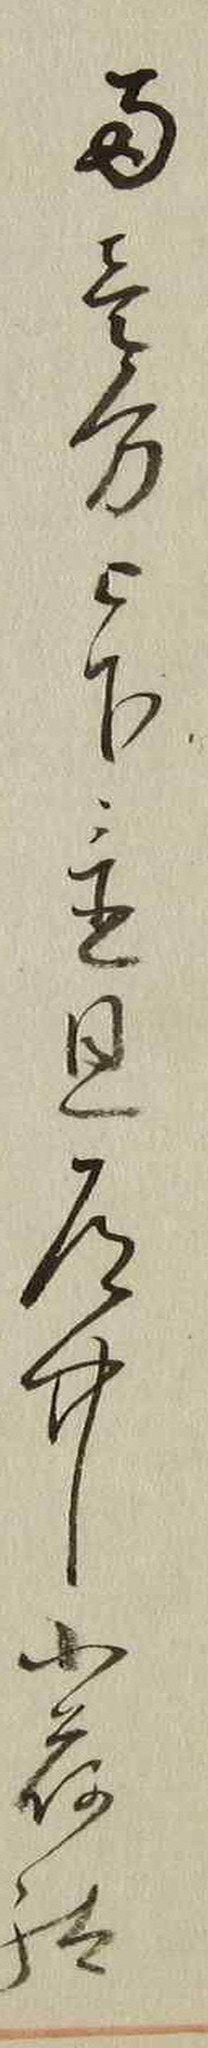両壱方被下置旦道中小荷駄
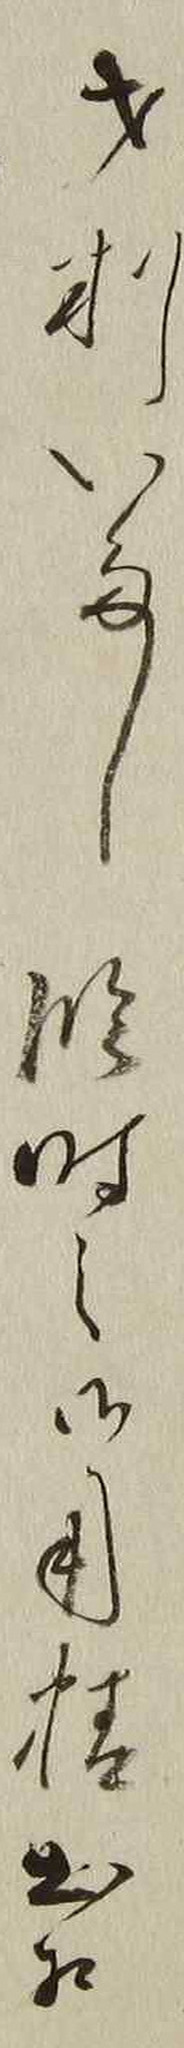才判いたし臨時之御用精出相
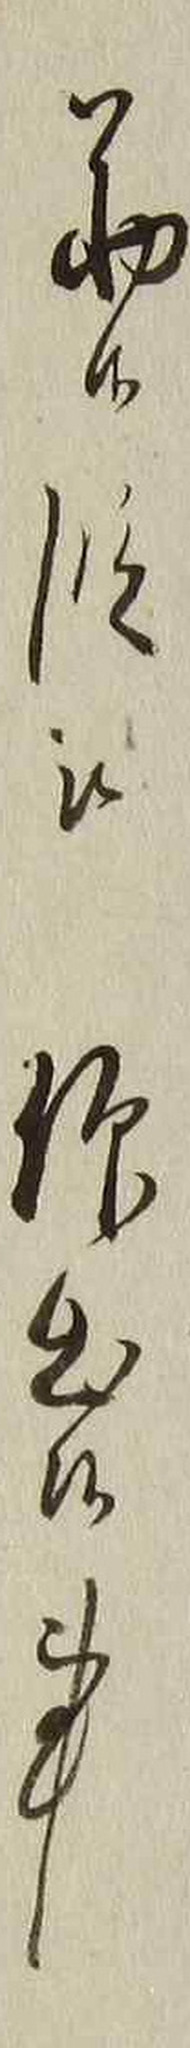勤候段被仰出候事
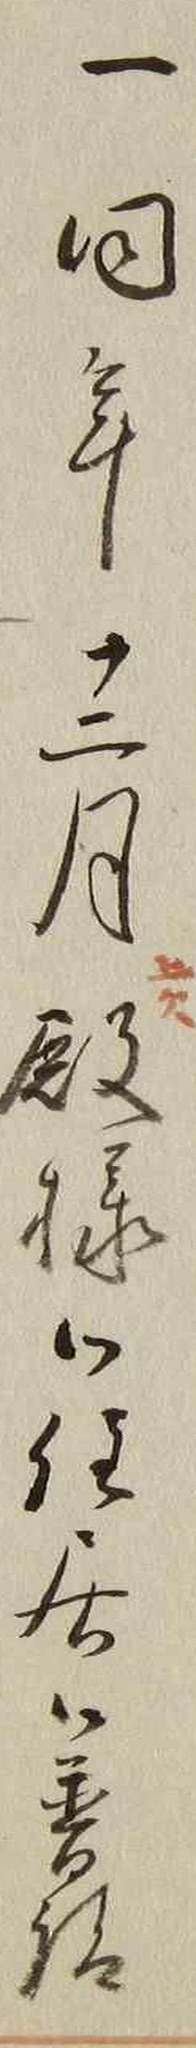一同年十二月殿様御住居御普請
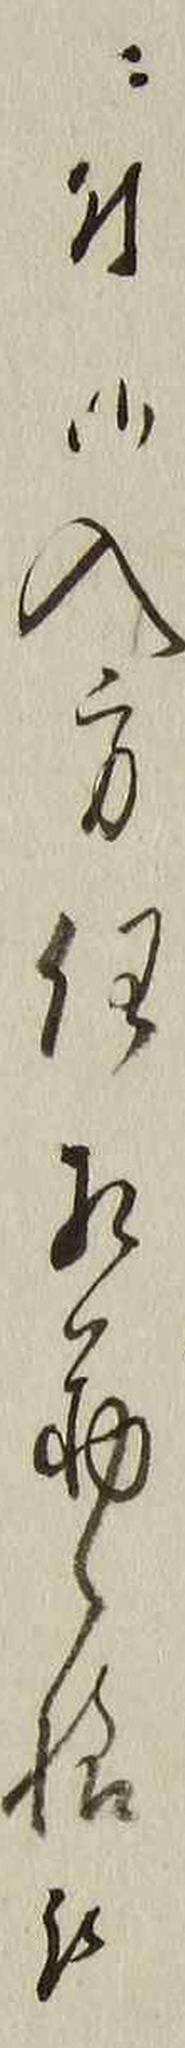ニ付御入方任相勤候様被
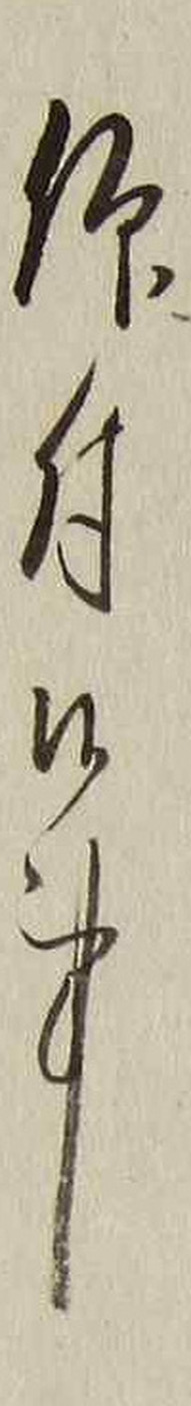仰付候事
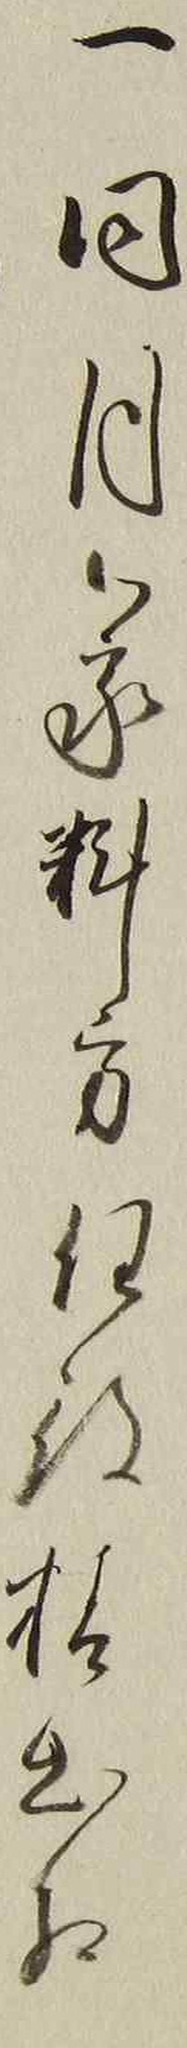一同月御家料方任役精出相
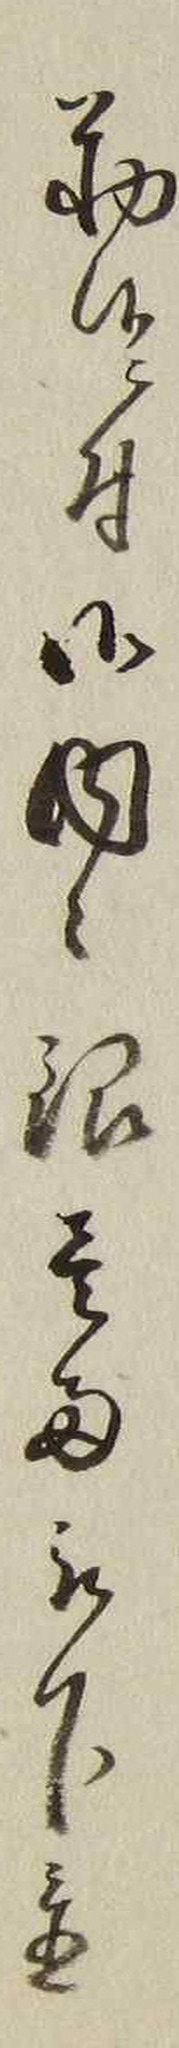勤候ニ付御内々銀壱両被下置
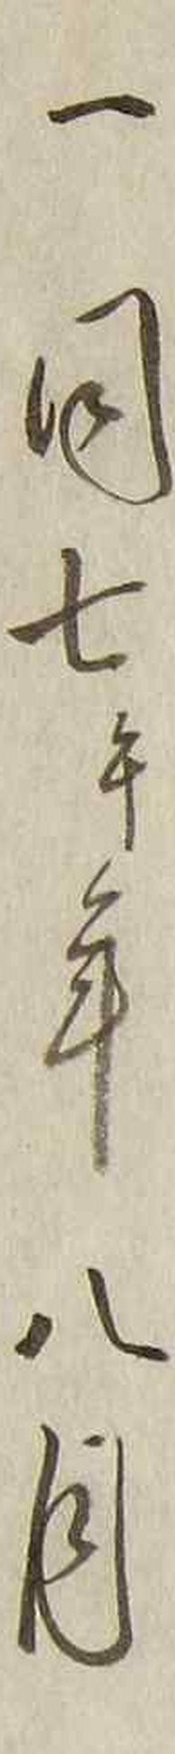一同七午年八月

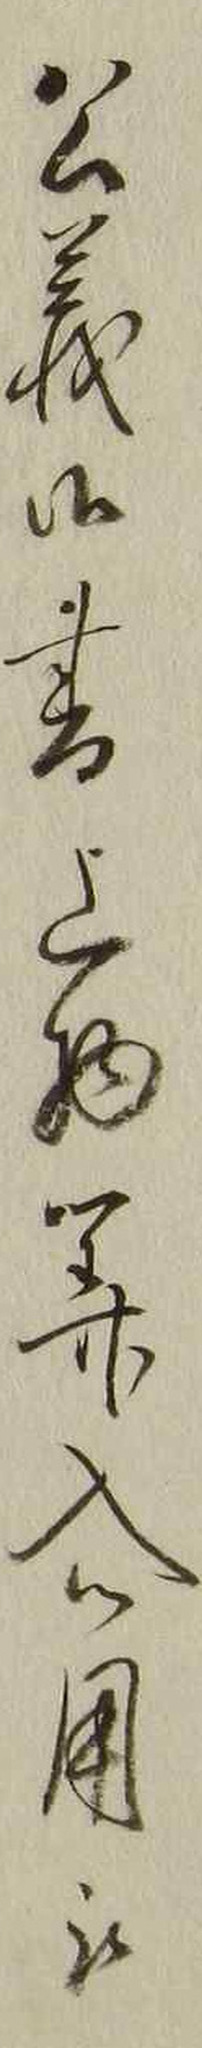公義御書上物算入御用被
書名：諸士系譜　巻之132　た之部8
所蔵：会津若松市立会津図書館
